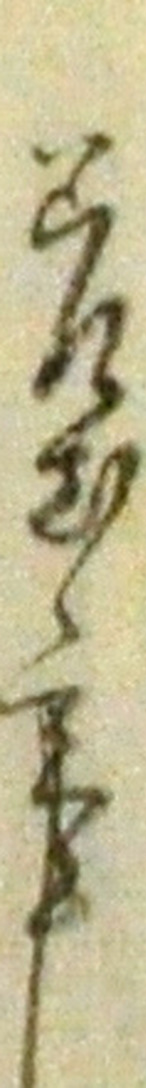差出候事
